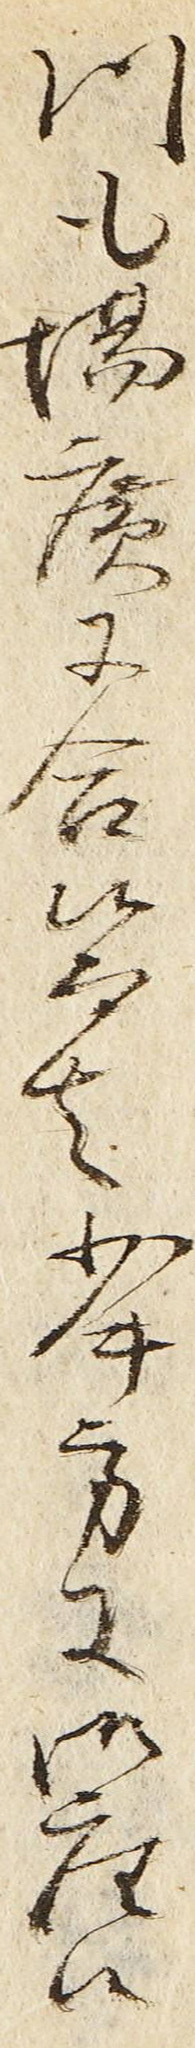川も場広に合候ては少キ方に御座候
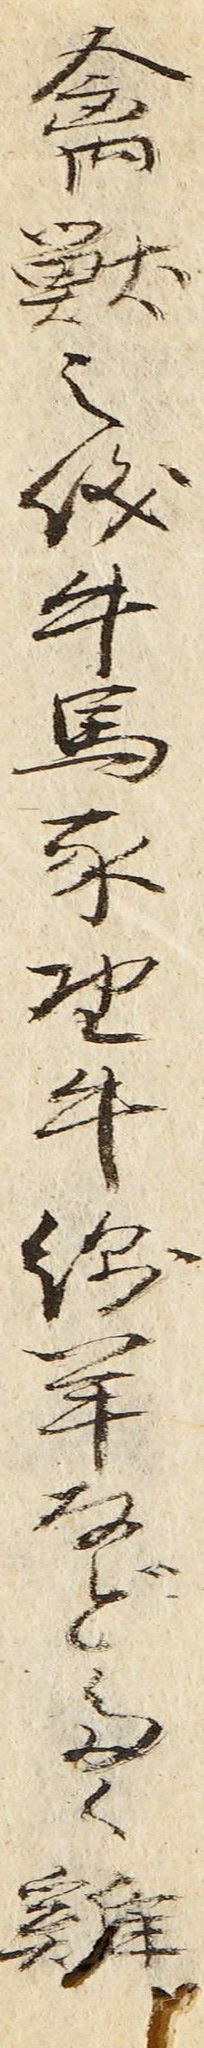禽獣之儀牛馬豕野牛綿羊など多く鶏
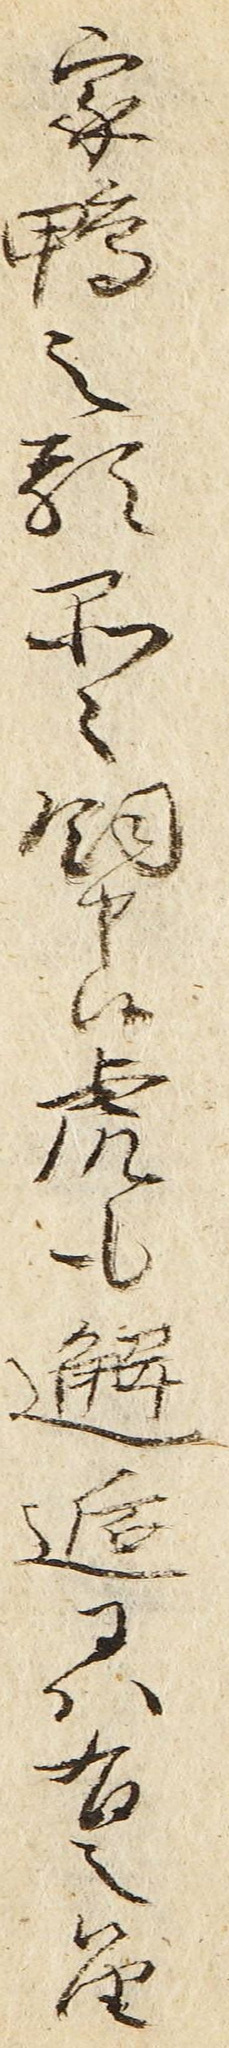家鴨之類品々飼申候虎も邂逅には有之候由
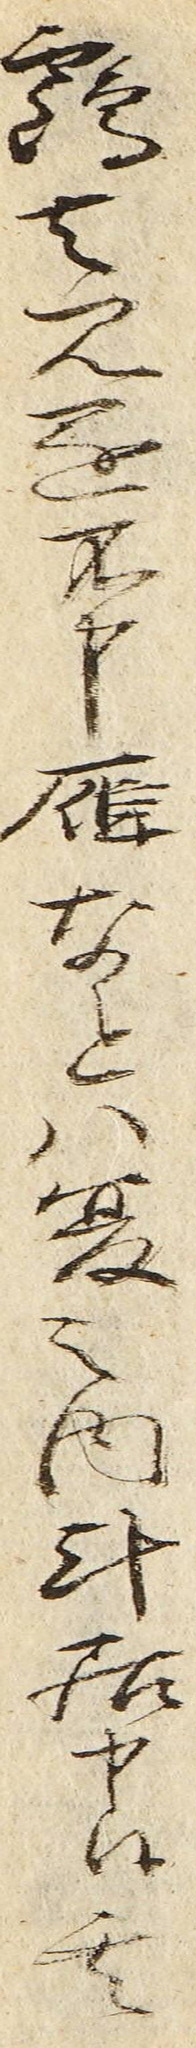鶴は見懸不申雁なとは夏之内斗居申候其
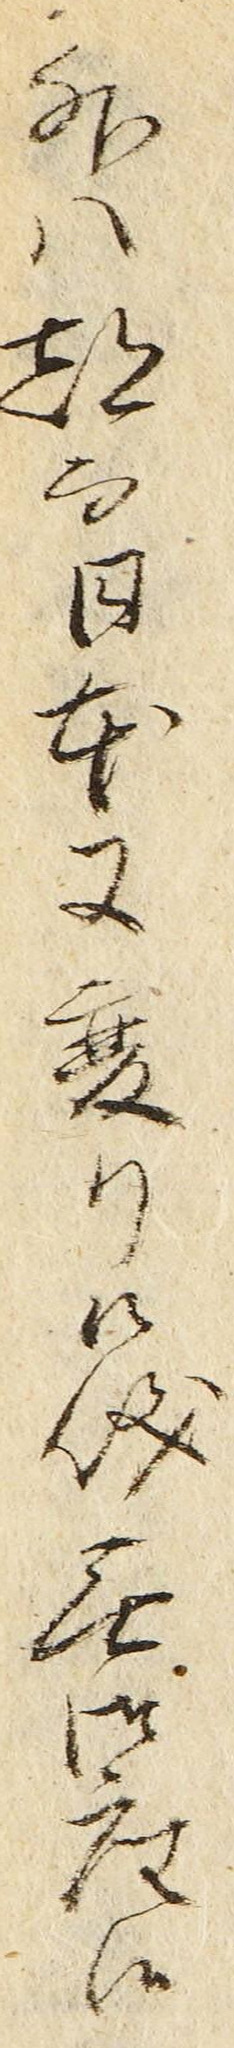外は都て日本に変り候儀無御座候

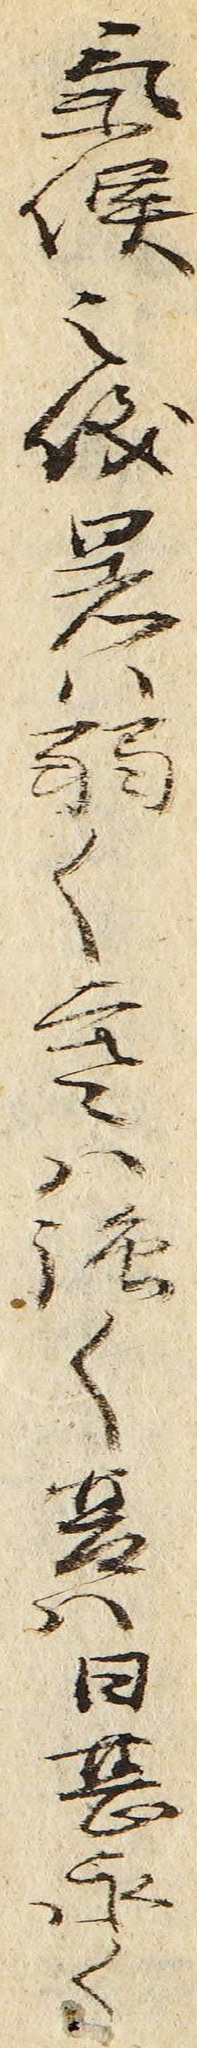気候之儀暑は弱く寒は強く夏は日甚永く
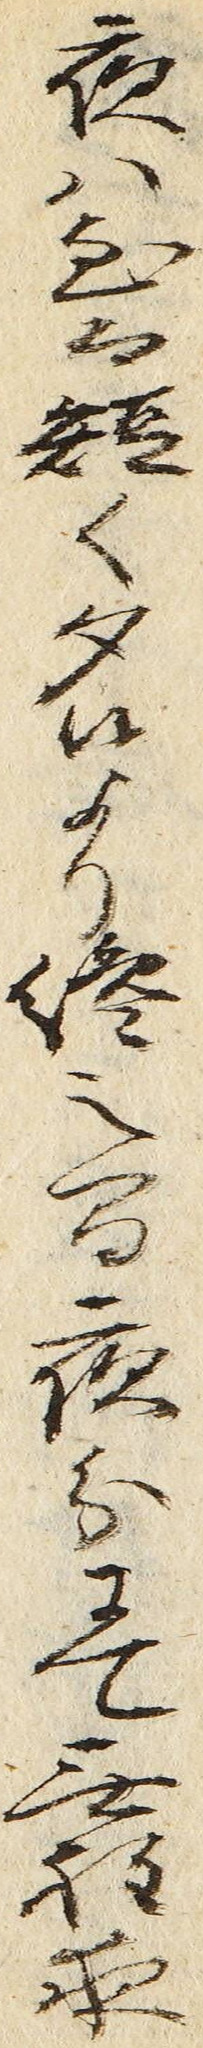夜は至て短く夕により纔之間夜分にて無程夜
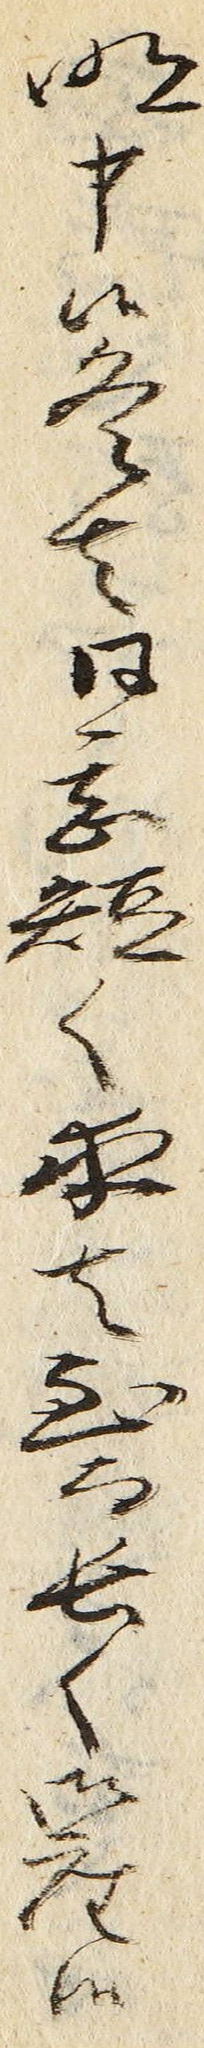明申候冬は日甚短く夜は至て長く御座候
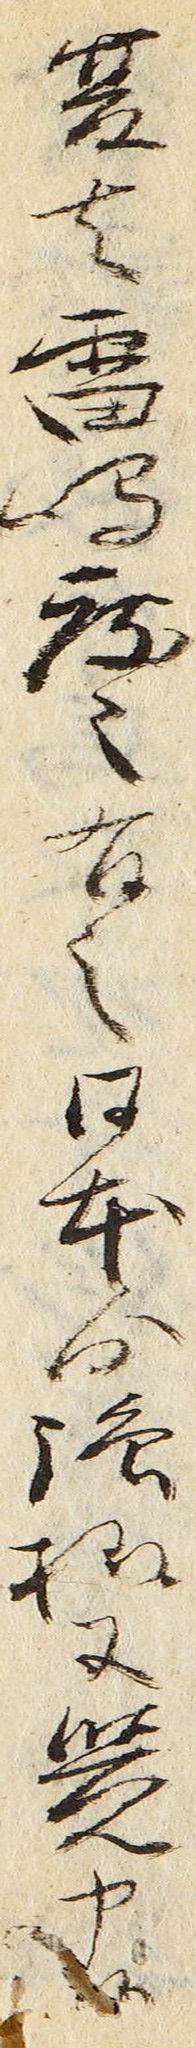夏は雷鳴度々有之日本ゟ強様に覚申候
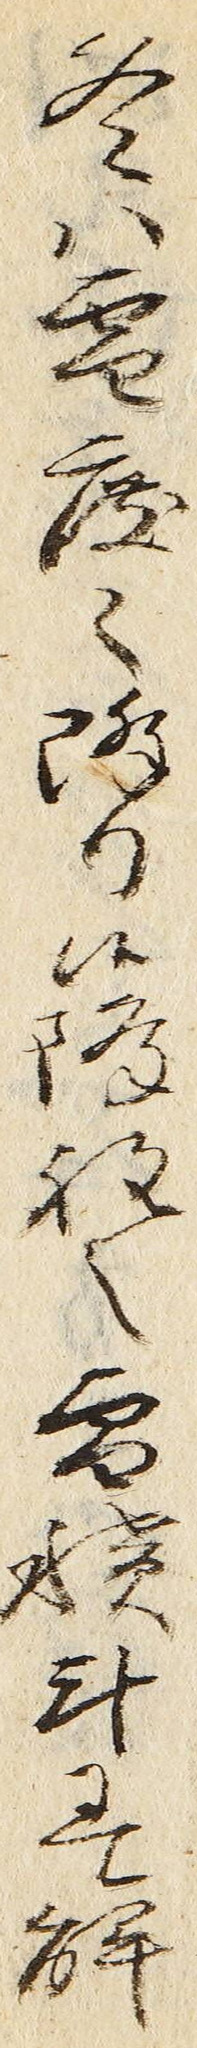冬は雪度々降り候降程之雪積斗にて解
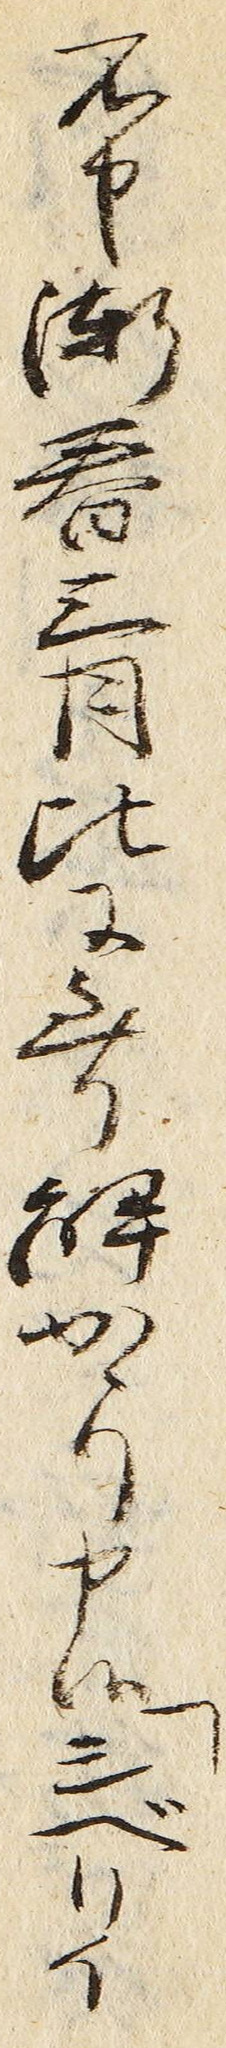不申漸春三月比に至り解かゝり申候「シベリイ
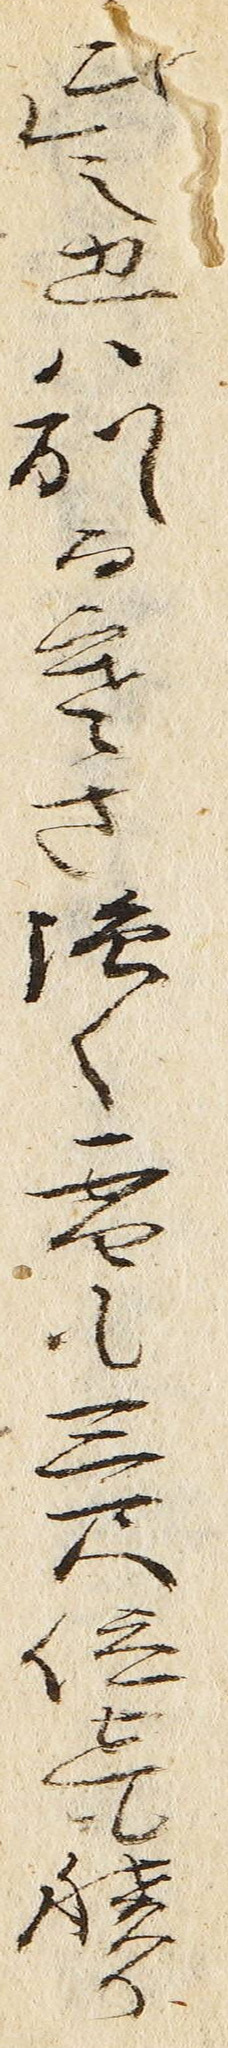ン」之辺は別て寒さ強く雪も三尺位迄も積り
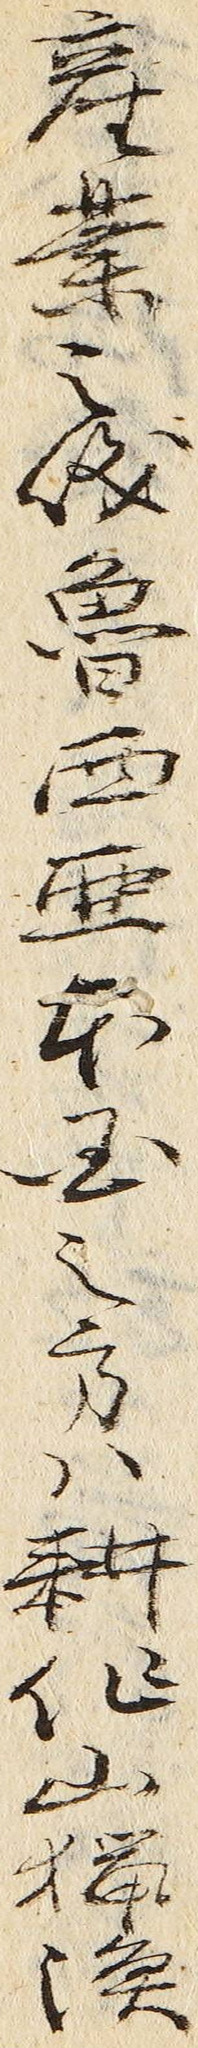産業之儀魯西亜本国之方は耕作山猟漁
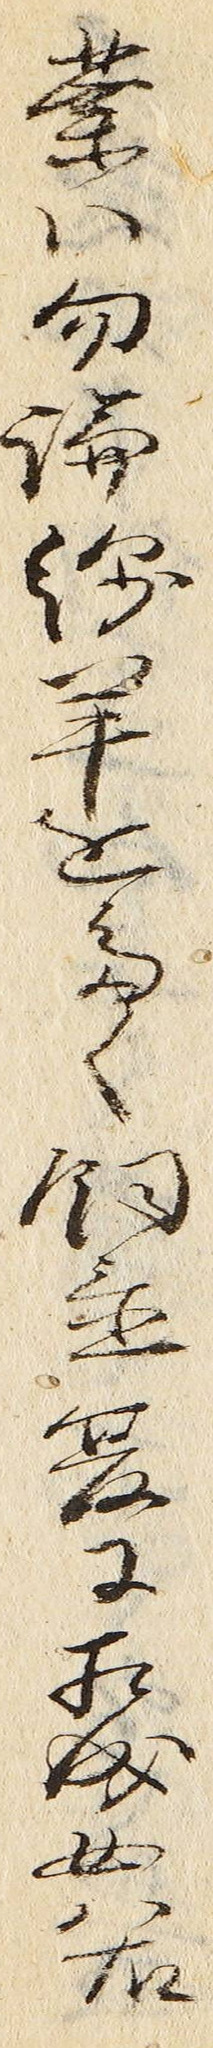業は勿論綿羊を多く飼置夏に相成女は右
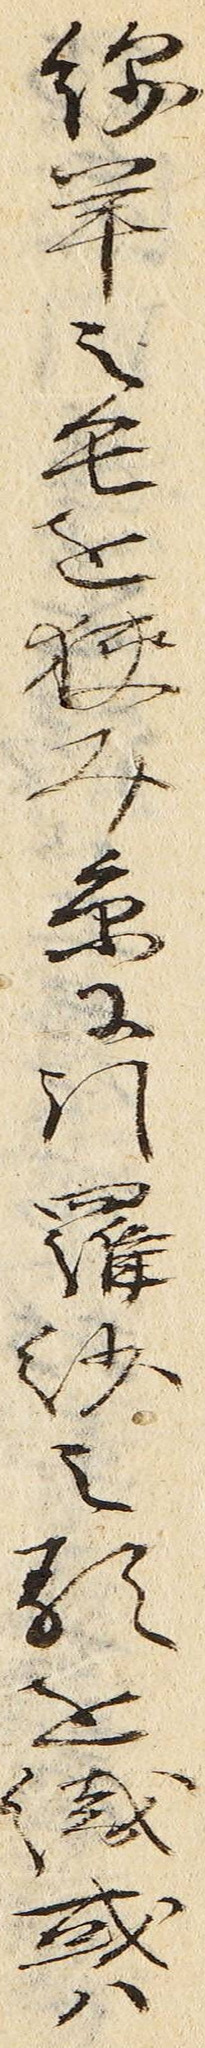綿羊之毛を挟み糸に引羅紗之類を織或は
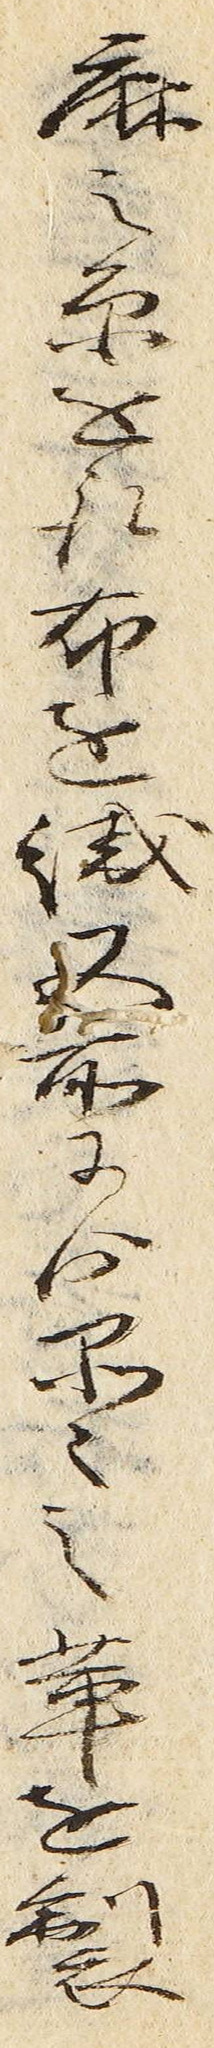麻之糸を取布を織又所にゟ品々之革を製
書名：漂民後記
